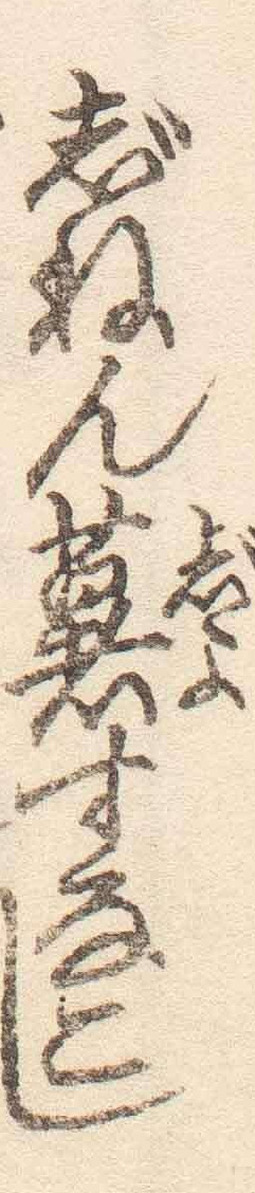じねん薯すなこし
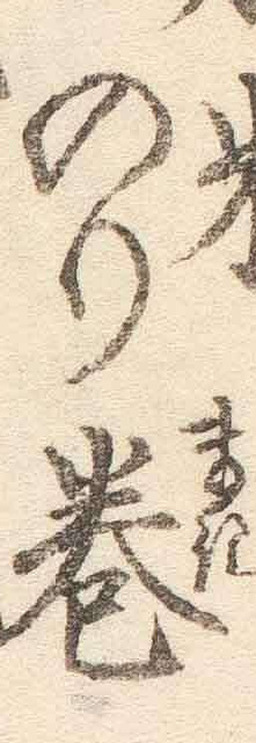のり巻
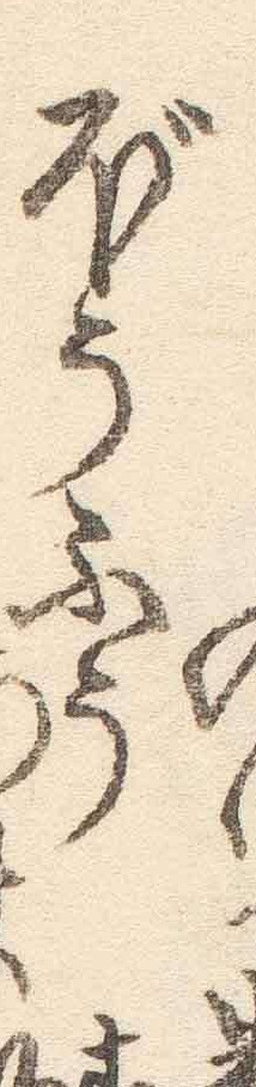ぼうふう
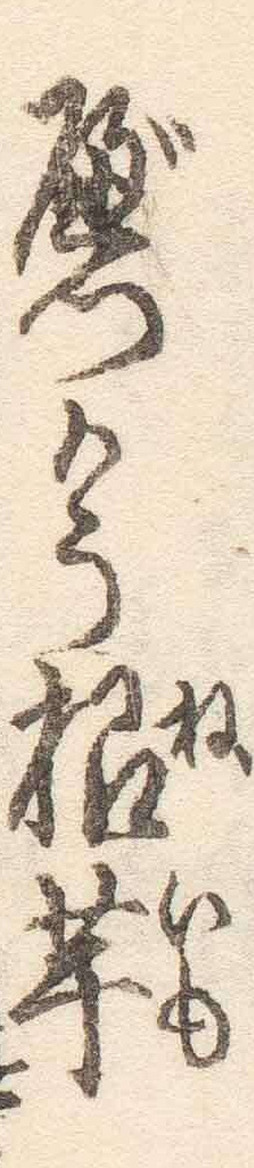べつかう根芋
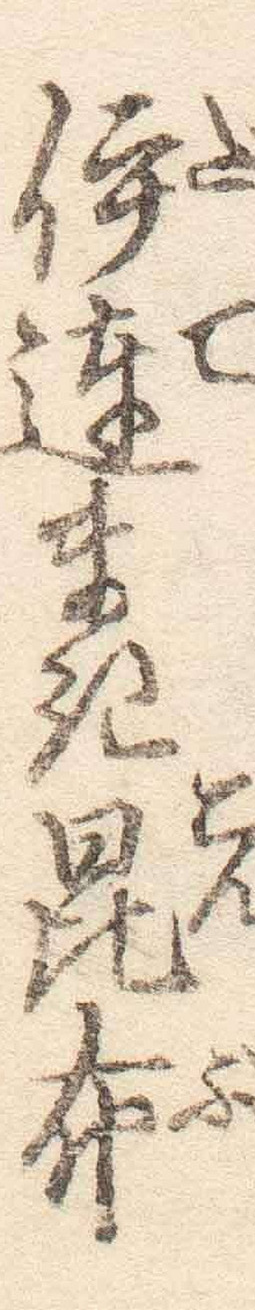伊達まき昆布
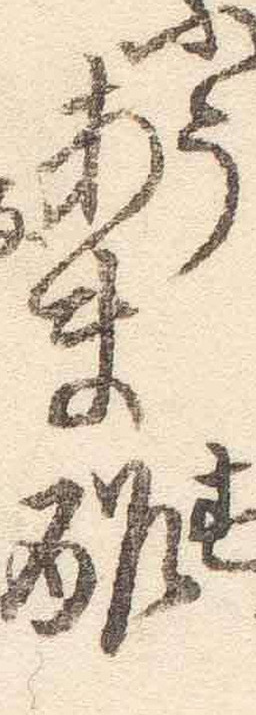あま酢
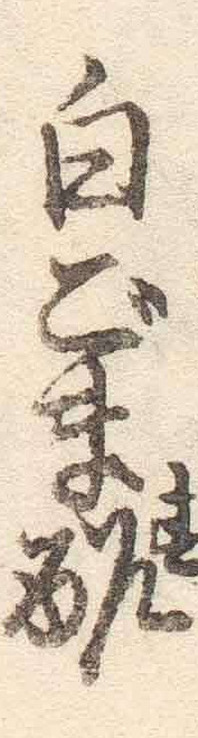白ごま酢
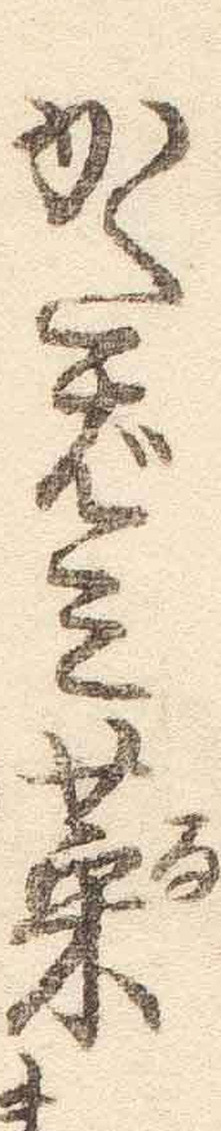かたばみ菜
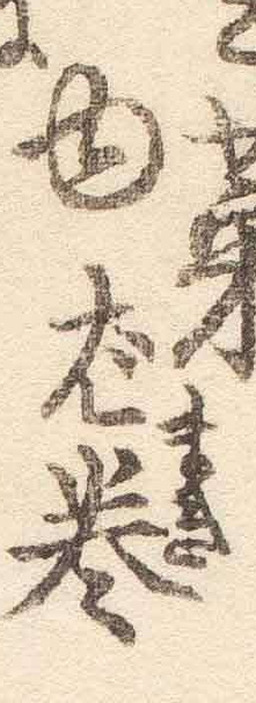ゆば巻
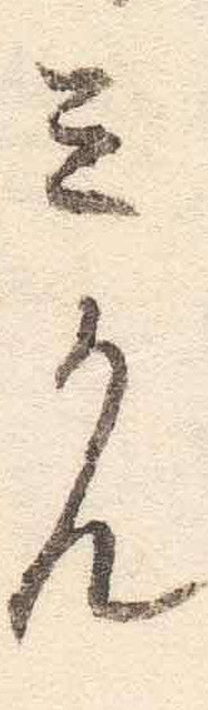みりん
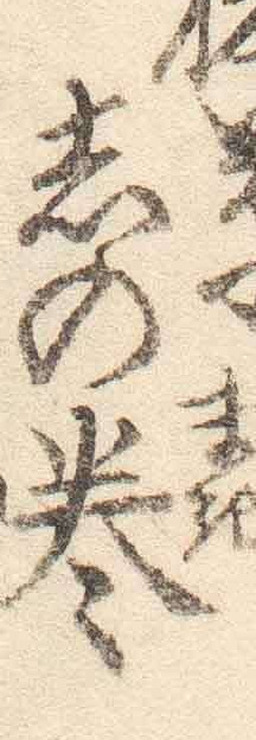しの巻
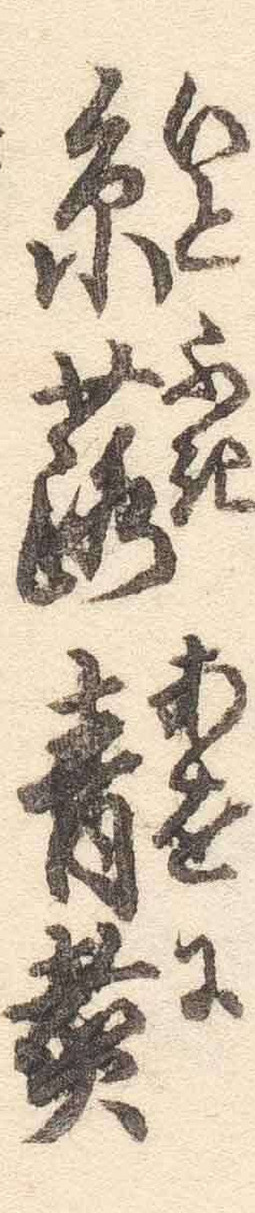糸蕗青煮
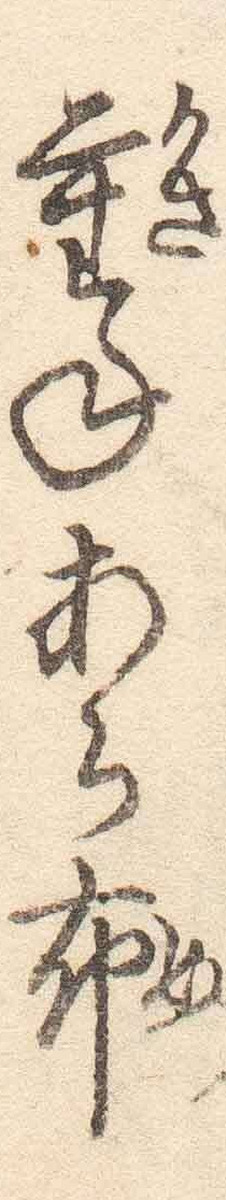重ねあら布
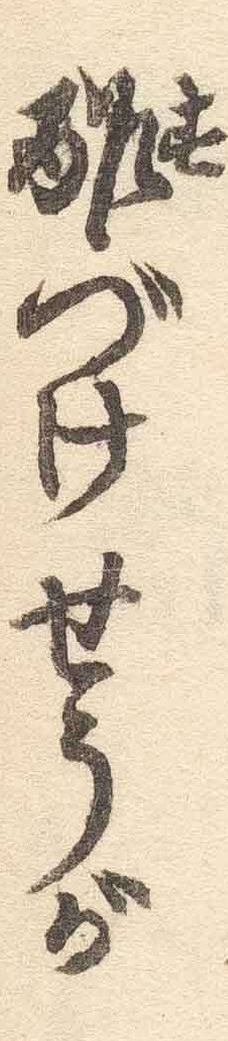酢づけせうが
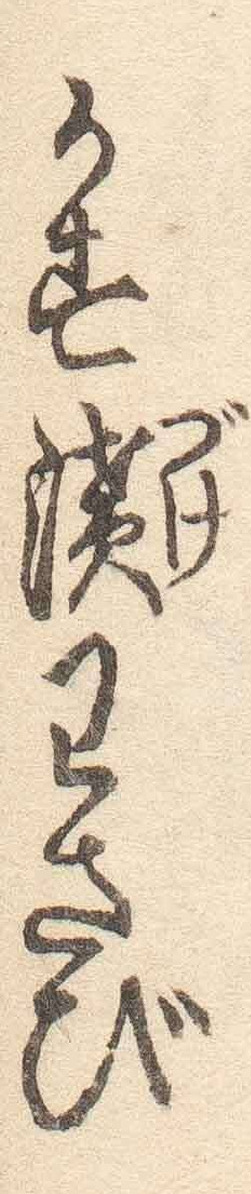かす漬わさび
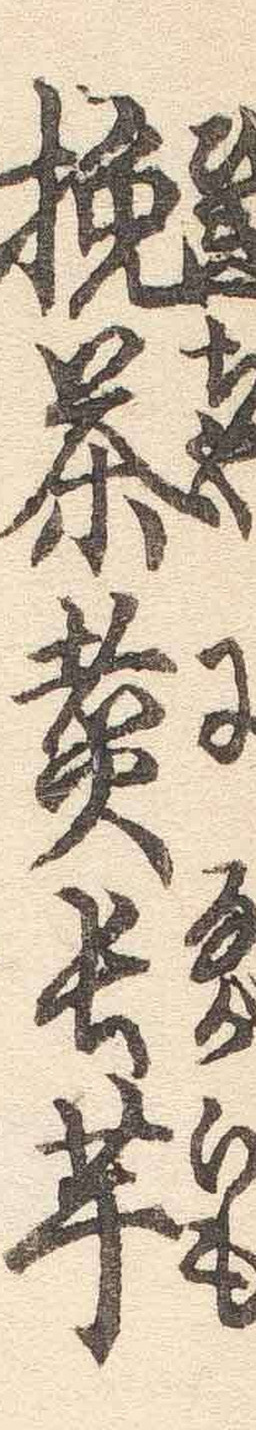挽茶煮長芋
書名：料理通
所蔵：東京学芸大学附属図書館 国文学研究資料館
